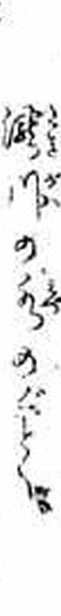瀧川の水のごとく
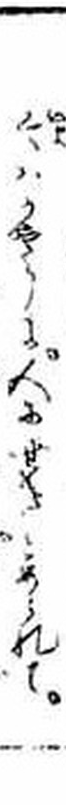今はかやうに人にせきとめられて徳
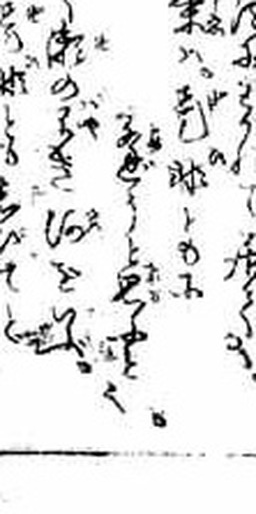逢うと思ふと也
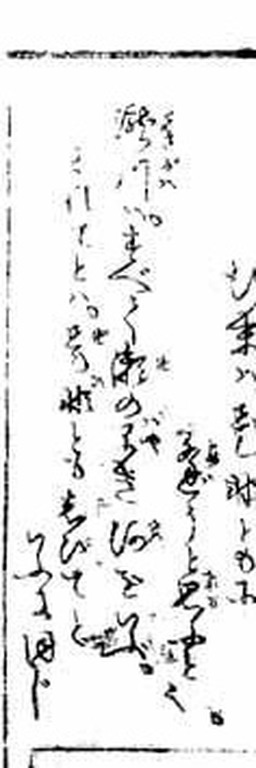瀧川はすべて瀬の早き河をいふ院
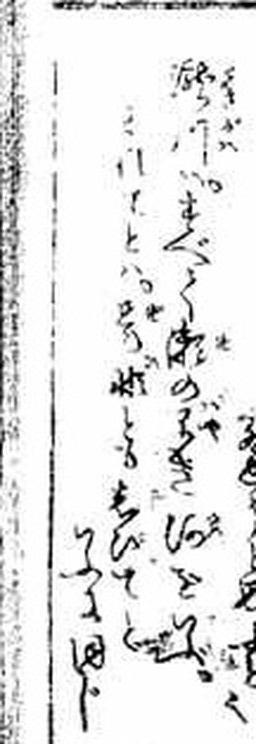われてもとは是非ともしひてと
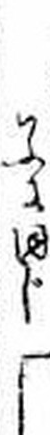いふに同じ

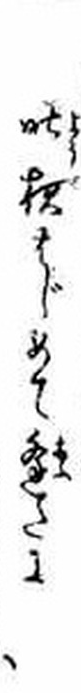昨夜はじめて逢たに
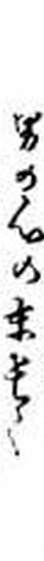男の心の末長く
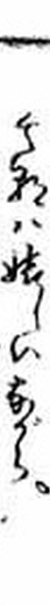今朝は嬉しいながら
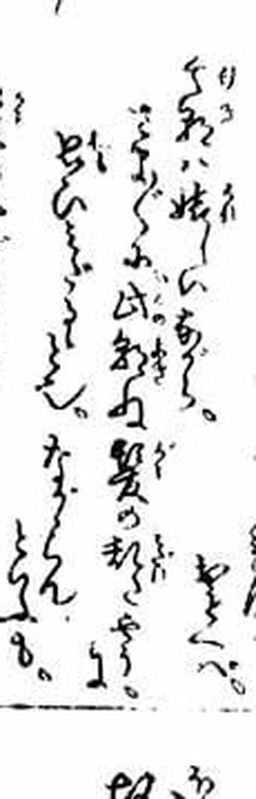さま〴〵に此の朝ね髪の乱れやうに堀
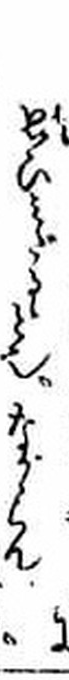思ひみだるゝとなりながからん
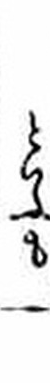といふも河
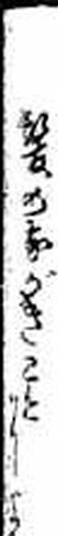髪のながきこと
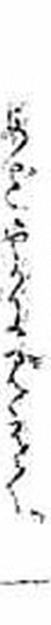あざやかに見えて左

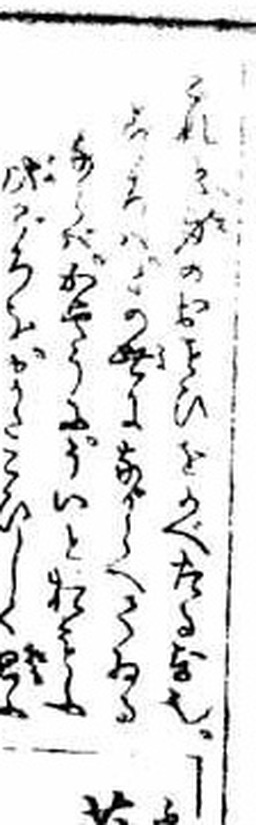こゝろはこの世にながらへてゐる藤
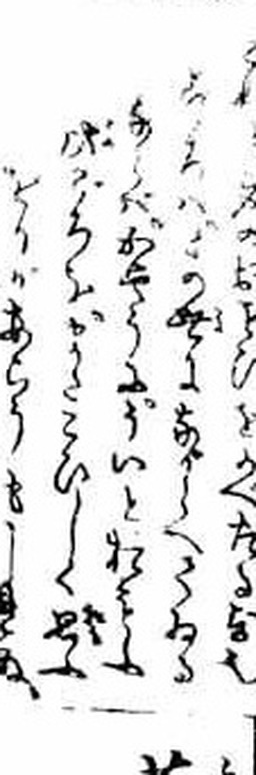ならばかやうにういとおもふ原
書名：小倉百人一首
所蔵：東京学芸大学教育コンテンツアーカイブ
